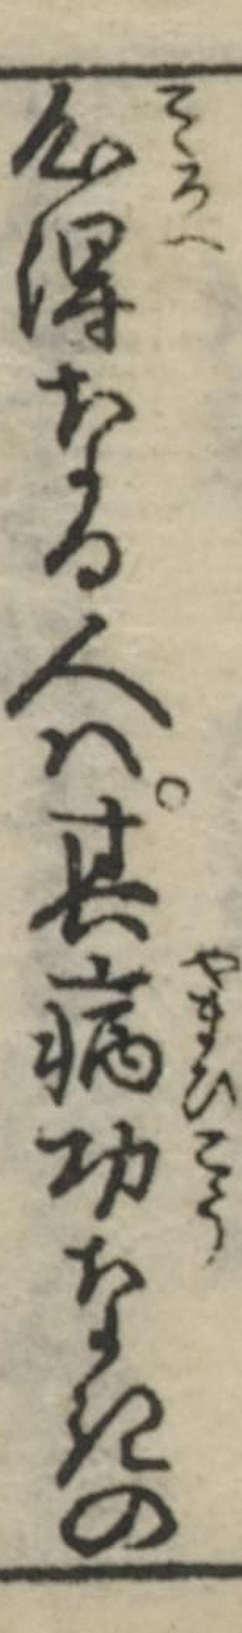心得なる人は。其病功なきの
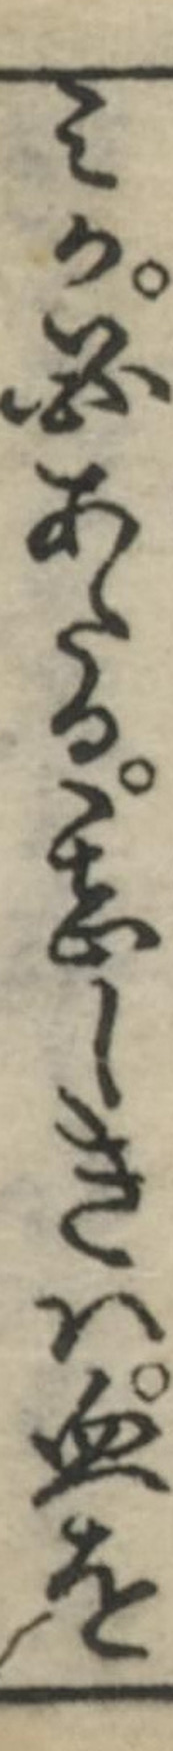みか。必あたる。甚しきは。血を

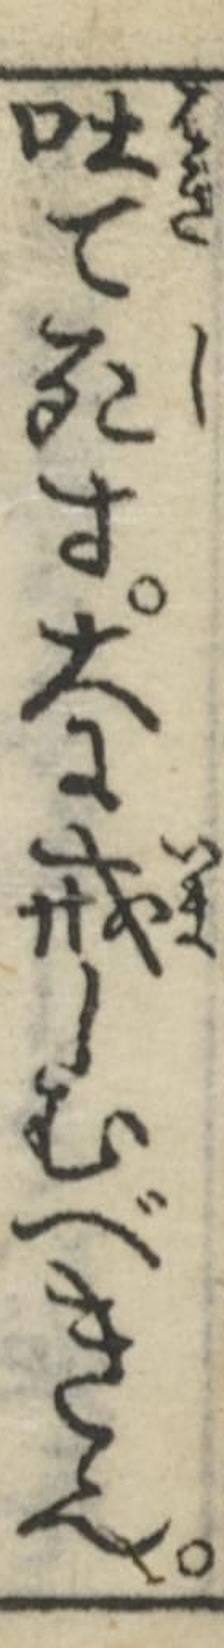吐て死す。大に戒しむべき也。
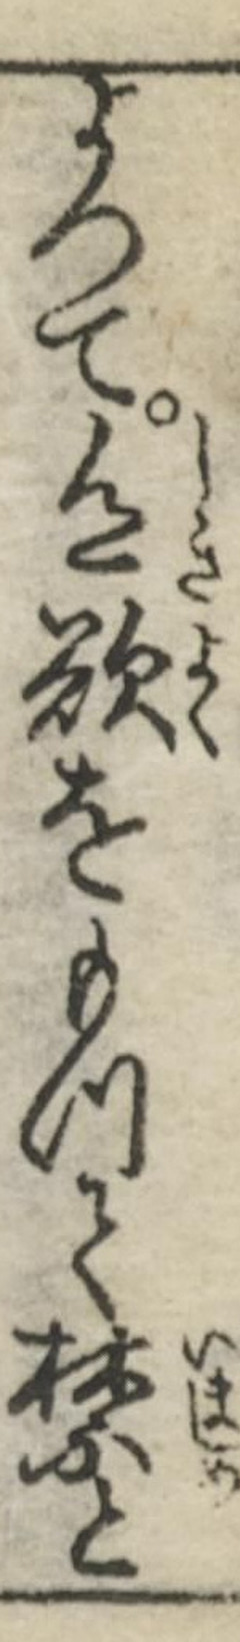よつて。色欲をもつて禁と
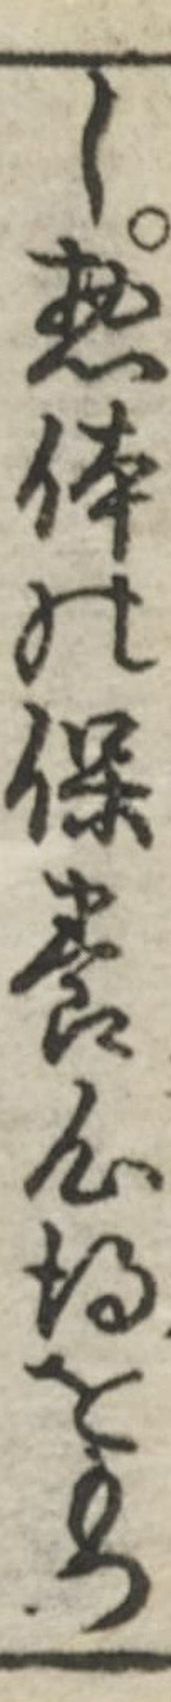し。惣体の保養心得をもつ
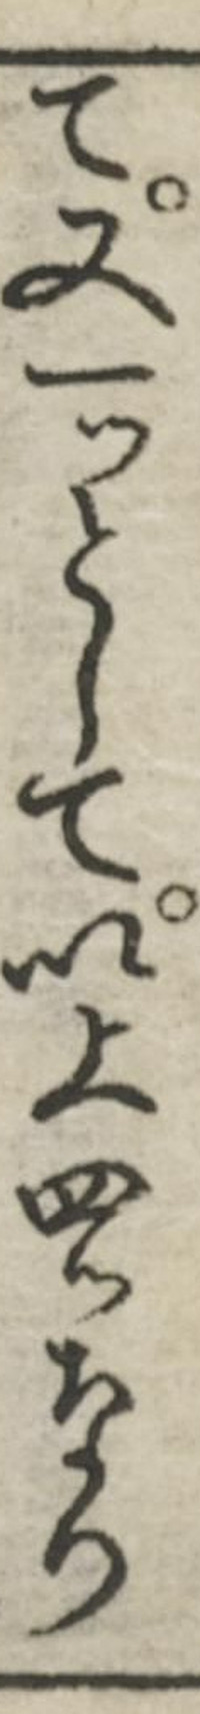て。又一つとして。以上四つなり
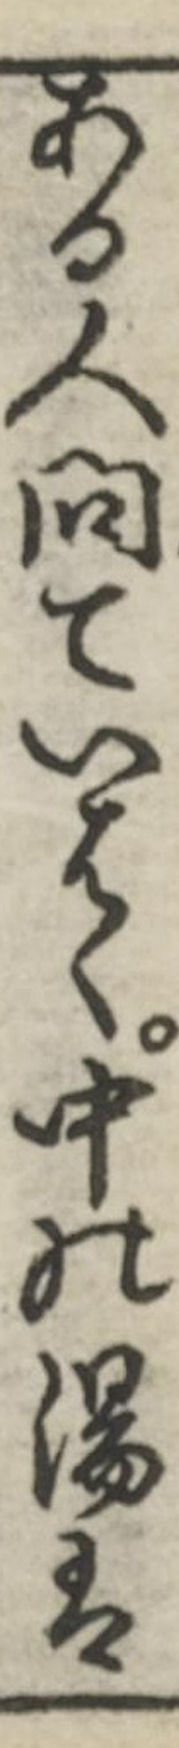ある人問ていはく。中の湯は
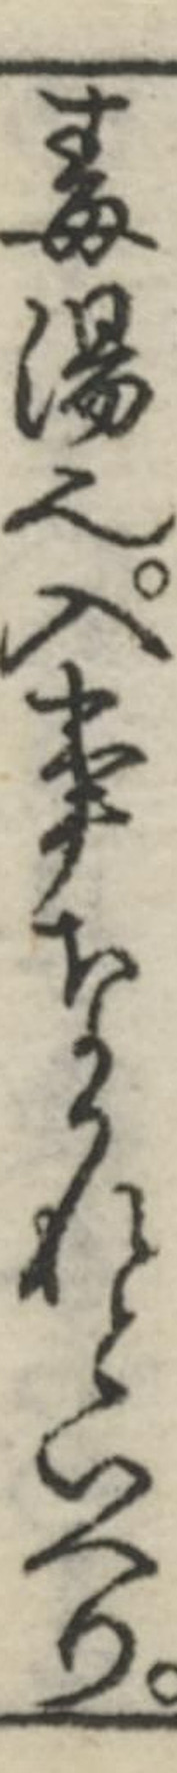毒湯也。入事なかれといへり。
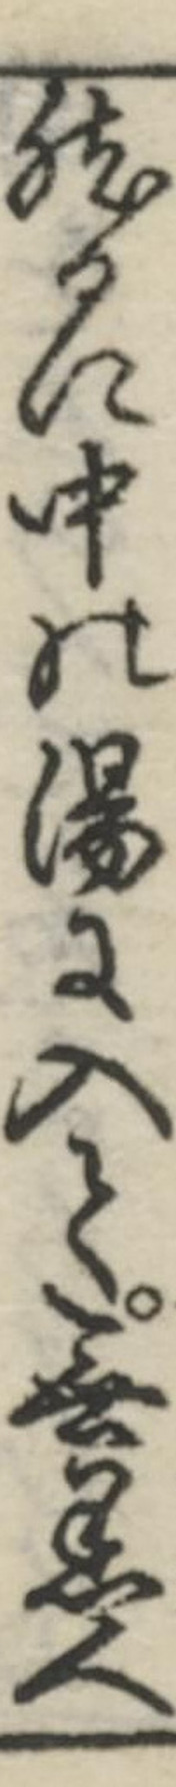然るに中の湯に入て。無恙人
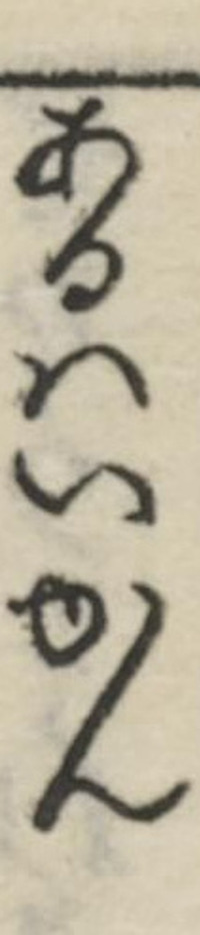あるはいかん
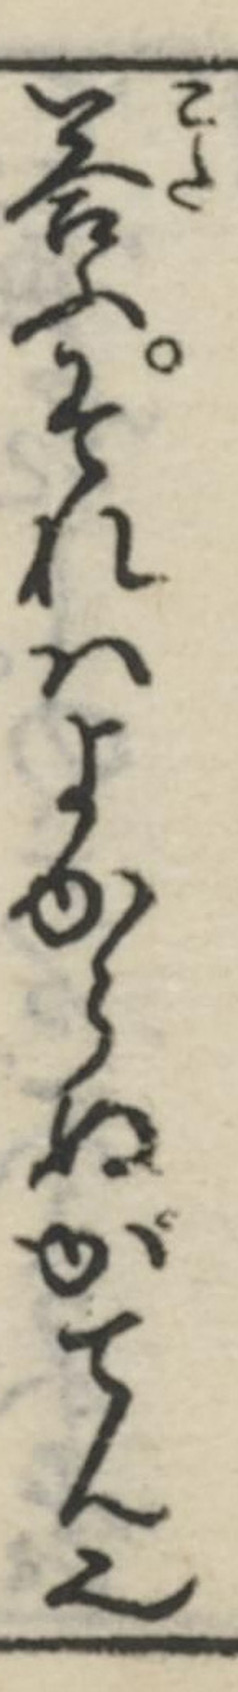答ふ。それはよからぬがてん也
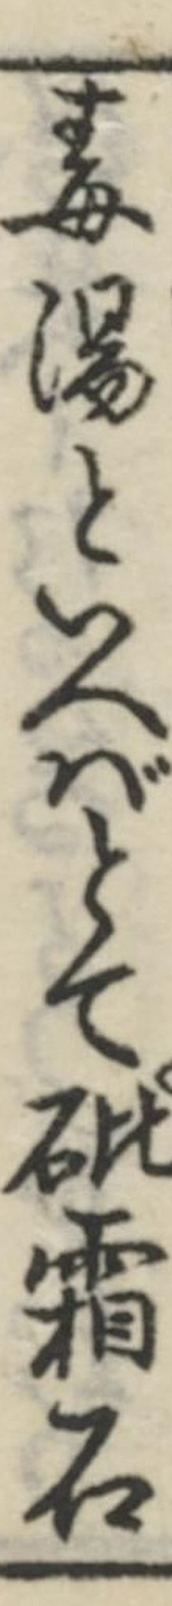毒湯といへばとて。砒霜石
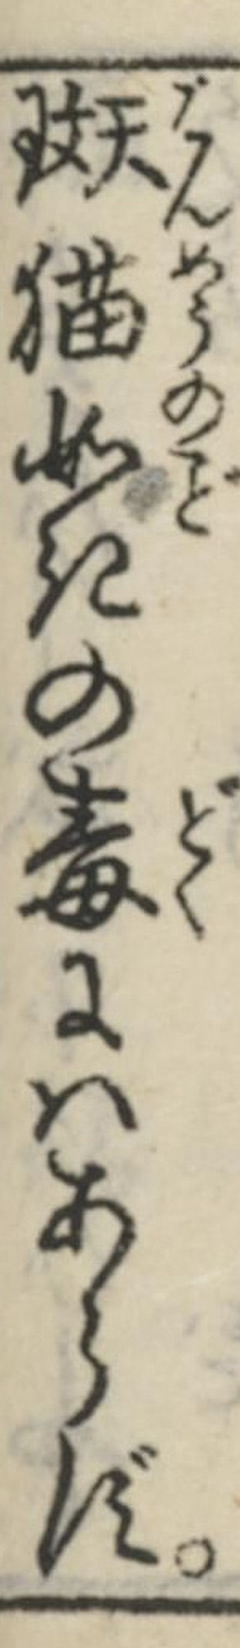斑猫如きの毒にはあらず。
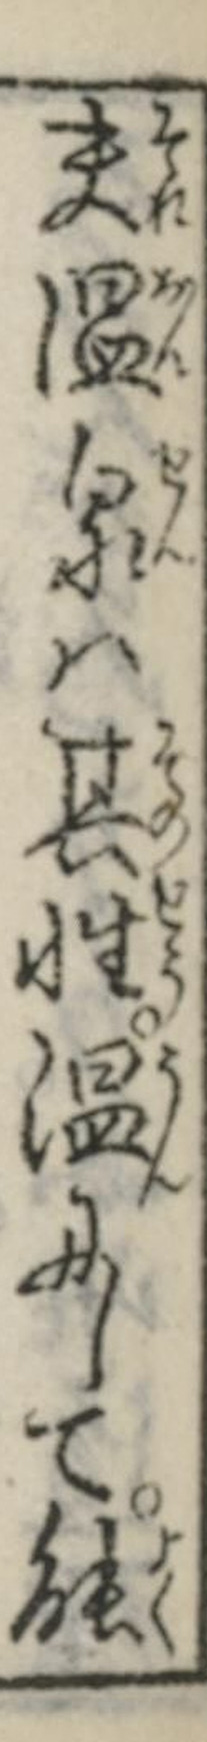夫温泉は其性。温にして。能
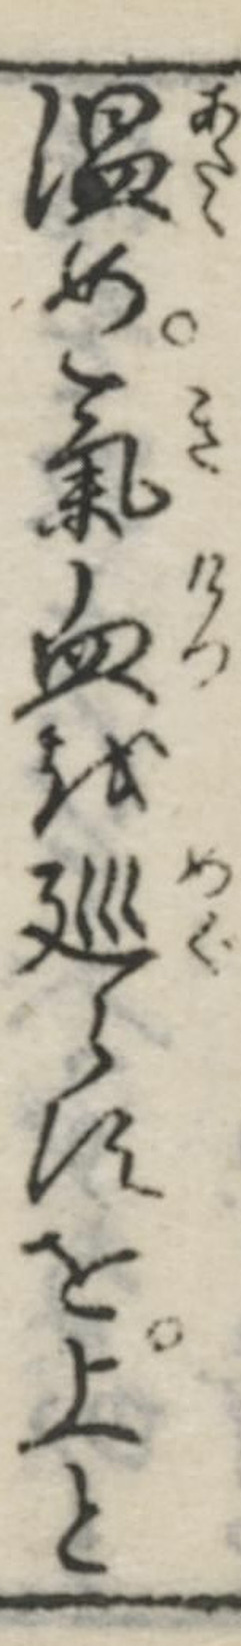温め。気血を巡らすを。上と
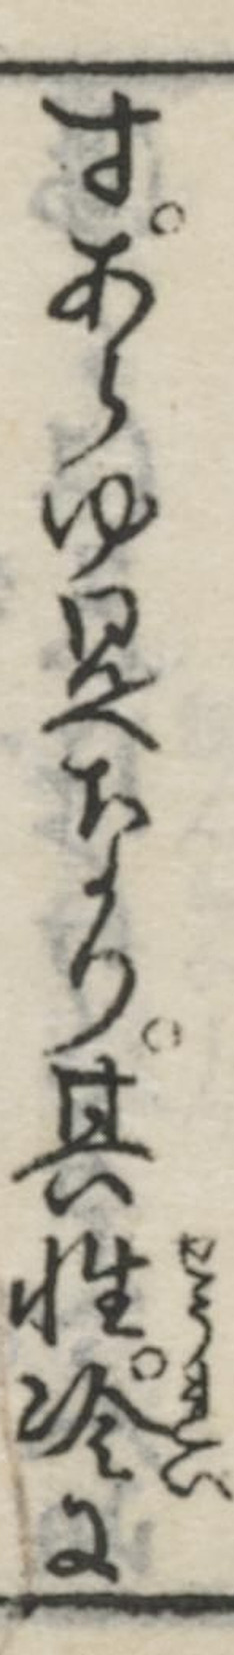す。あらゆ是なり。其性。冷に
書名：但州城崎浴湯辧
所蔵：東京大学地震研究所図書室 Earthquake Research Institute Library, The University of Tokyo, JAPAN
